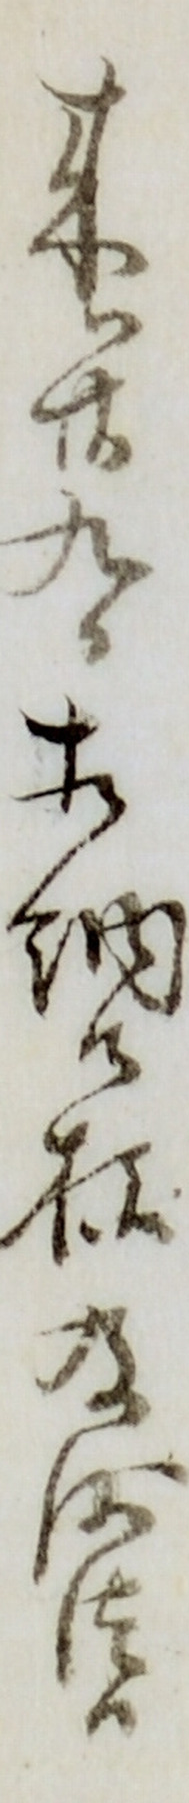来ル廿九日相納候様及沙汰候
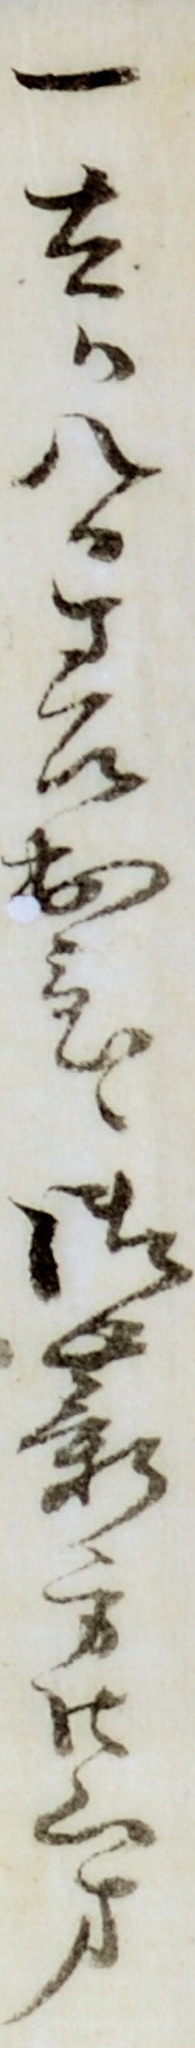一去ル八日差出置候御薪方御山方
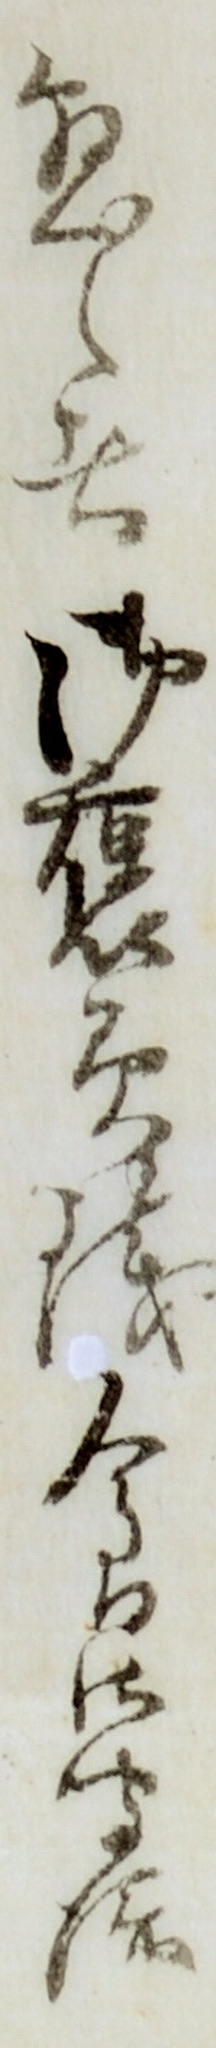懸之者御褒美銭今日御聞済

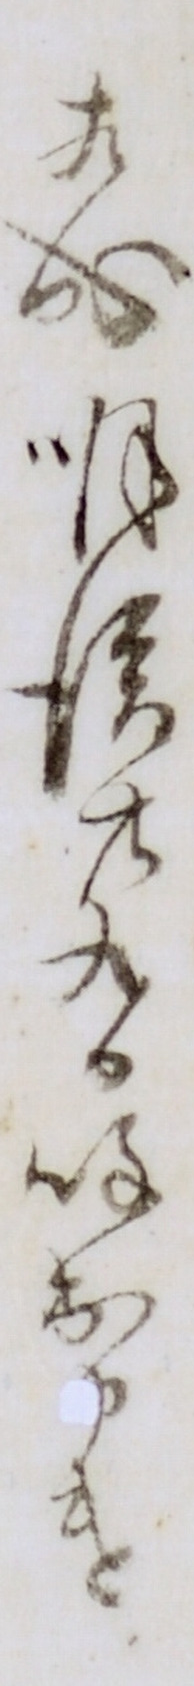相成明後廿九日呼出申遣
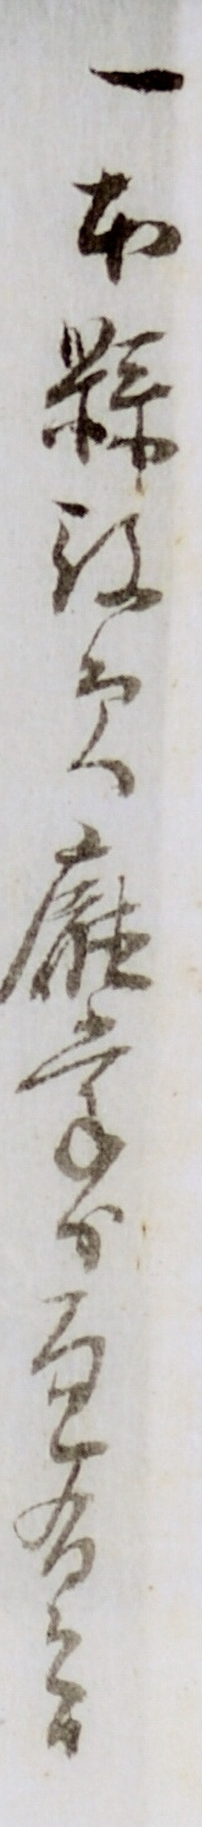一本県役員庁掌ゟ通有之候
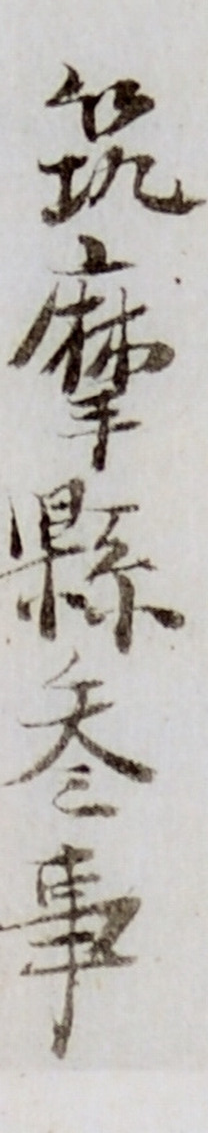筑摩県参事
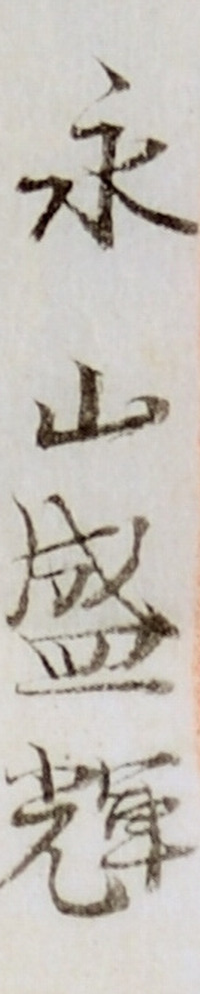永山盛輝
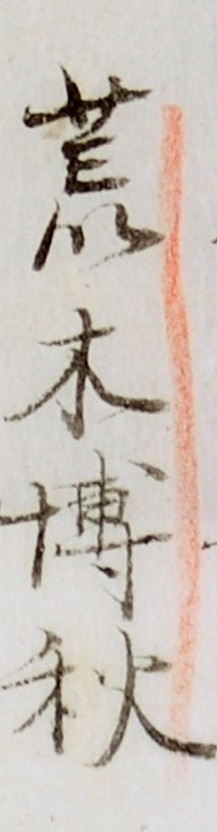荒木博秋
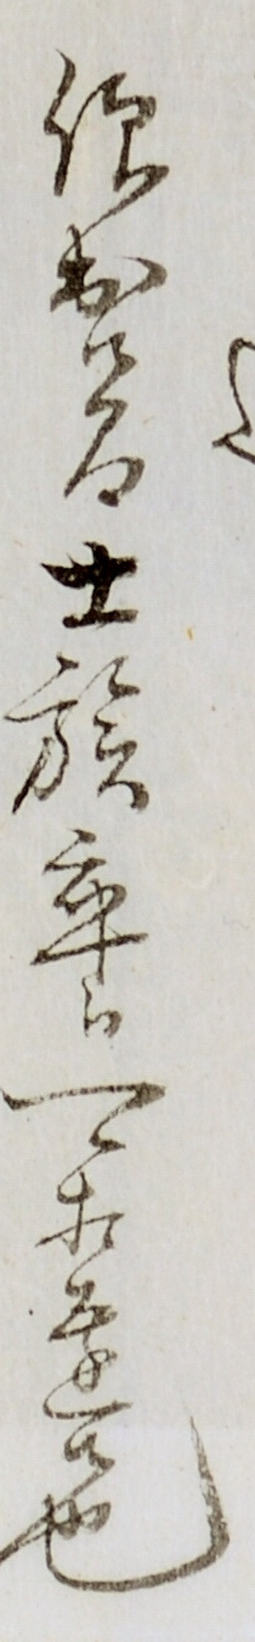仰出候間士族卒え可相達候也
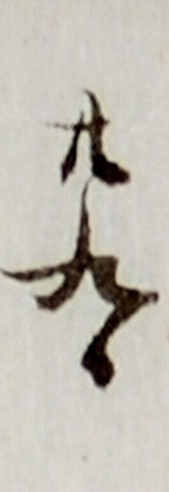廿九日
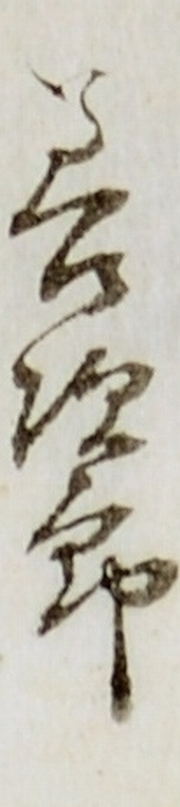善次郎
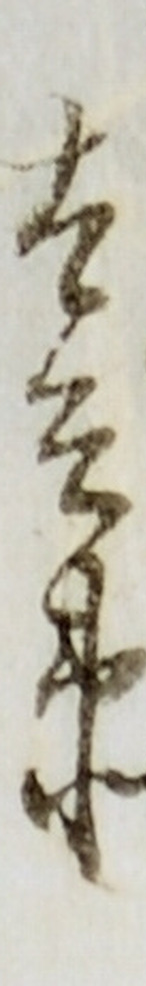太兵衛
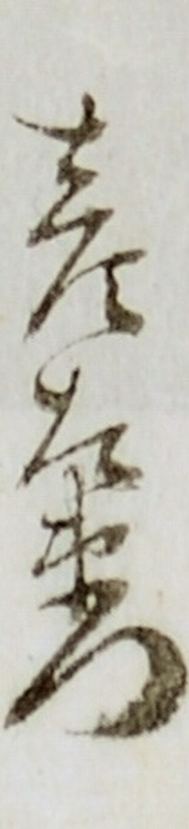彦左衛門
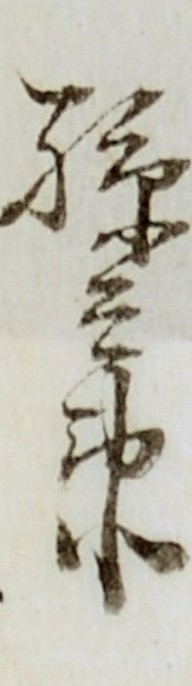孫兵衛
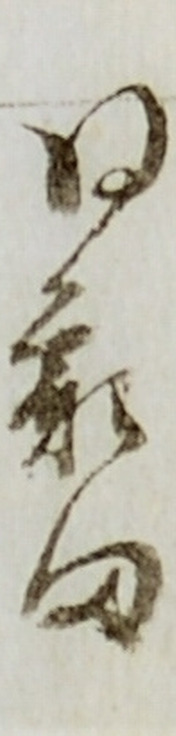同新田
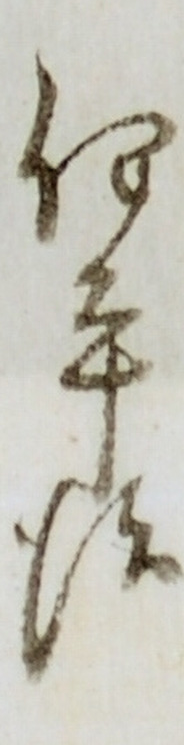伊平治
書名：山林方諸事御用留
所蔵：伊那市立高遠町図書館・合同会社AMANE
